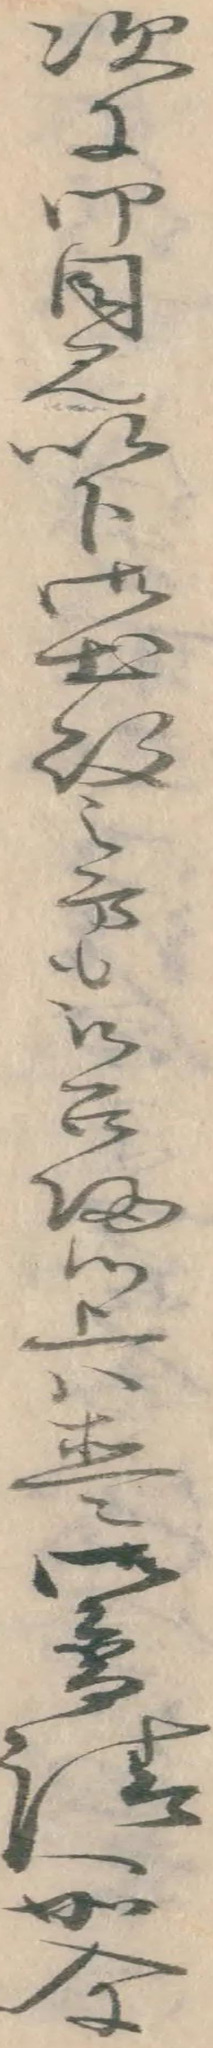次に御目見以下御出役之方も被召帰候上は直に御普請へ加入に
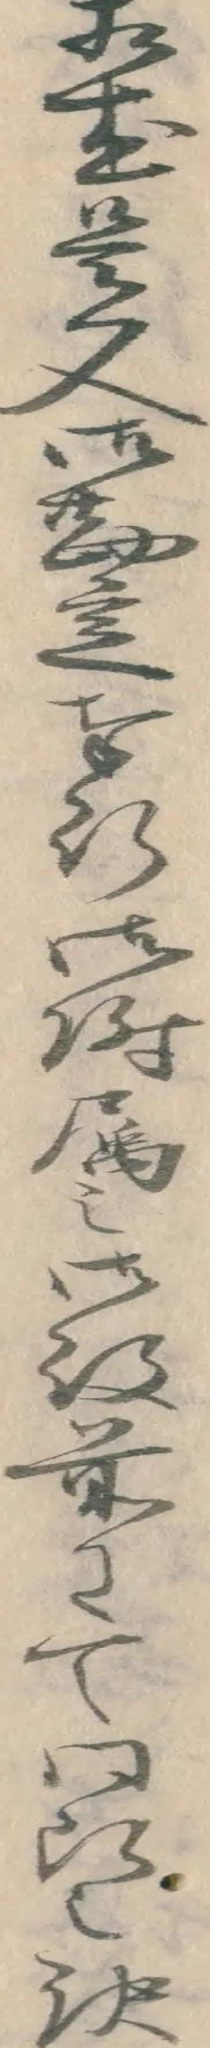相成是又御勘定奉行御附属之御役前にて同断之訳
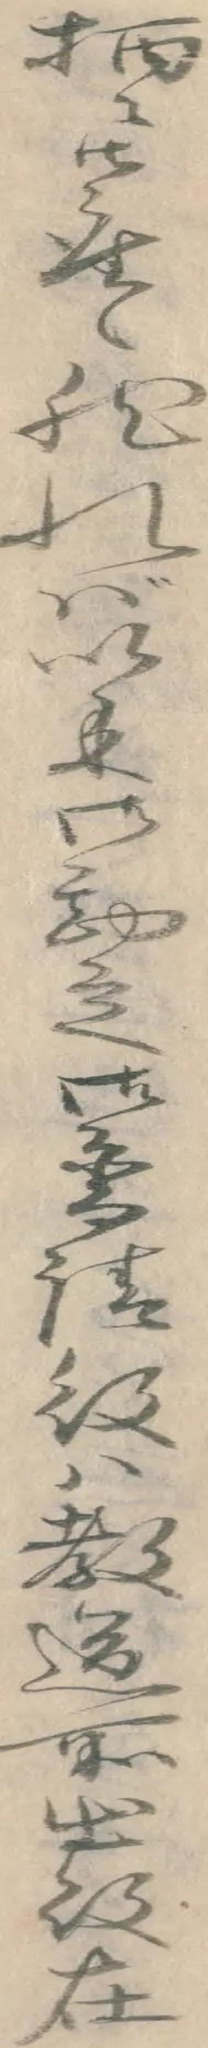柄に御座候然れば以来御勘定御普請役は教道所出役在
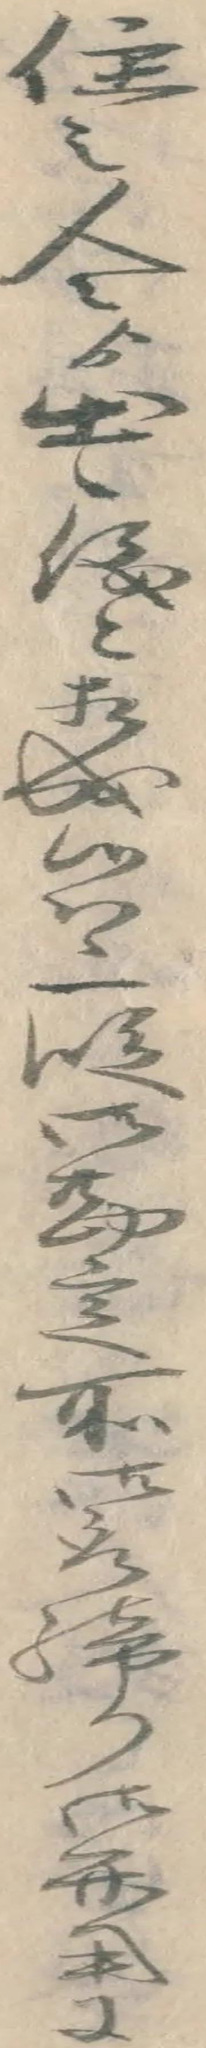住之人々ゟ出候儀と相成候はゝ一段御勘定所御取締り御弁用に
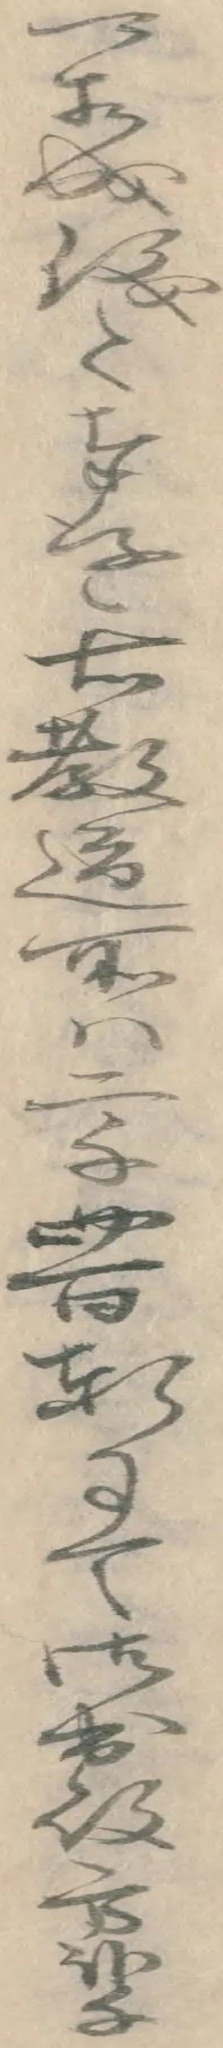可相成儀と奉存候右教道所は二千四百軒にて御出役方弐千

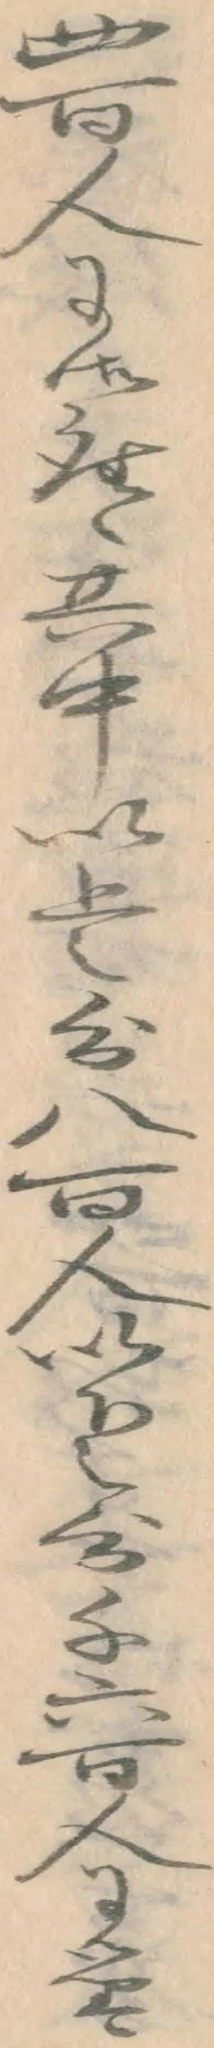四百人に御座候其中以上之分八百人以下之分千六百人に御坐候
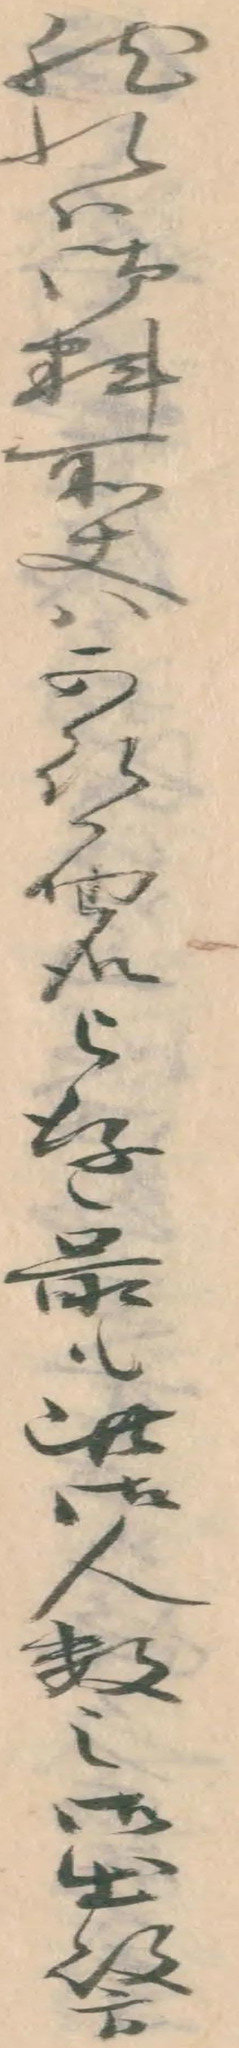然れは御料所丈は可行届様被存候最も此御人数之御出役方
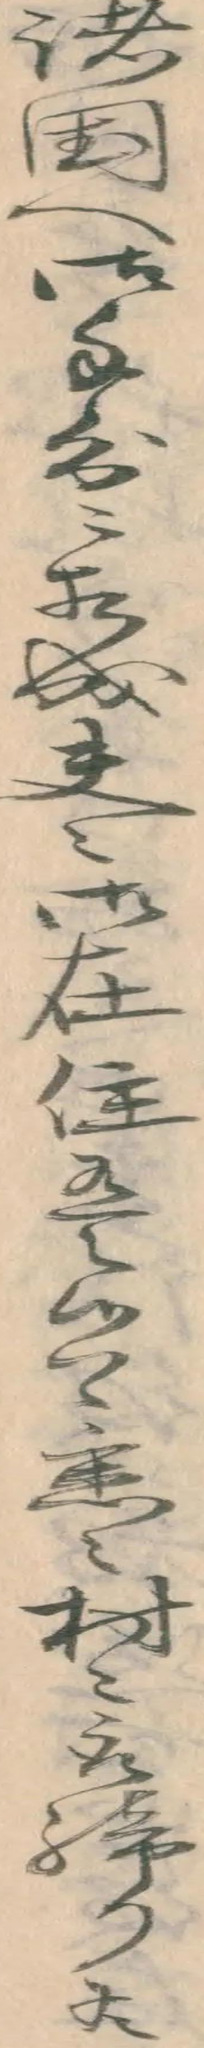諸国へ御手分に相成夫々御在住有之候はゝ悉に村々取締り候
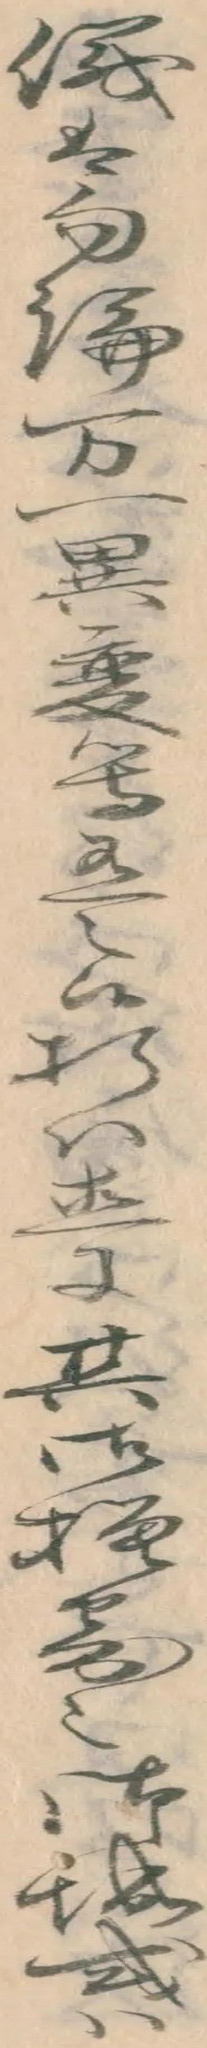儀は勿論万一異変等有之候折は直に其御模寄之御城或は
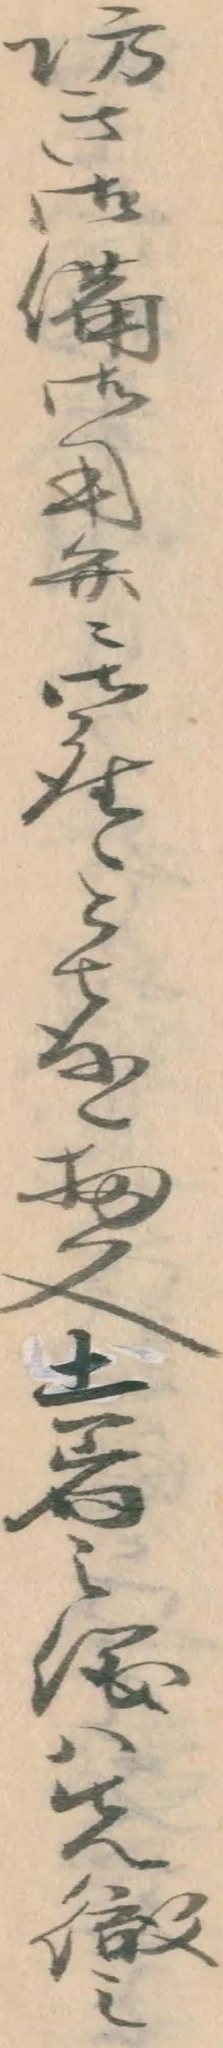防き御備御用弁に御座候と奉存候扨又土着之儀は先徹之
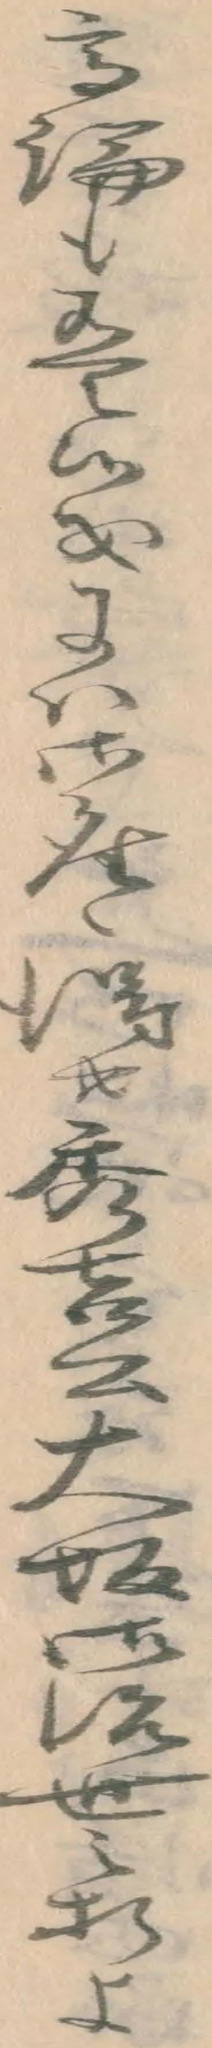高論も有之候義には御座候得共秀吉公大坂御治世之折よ
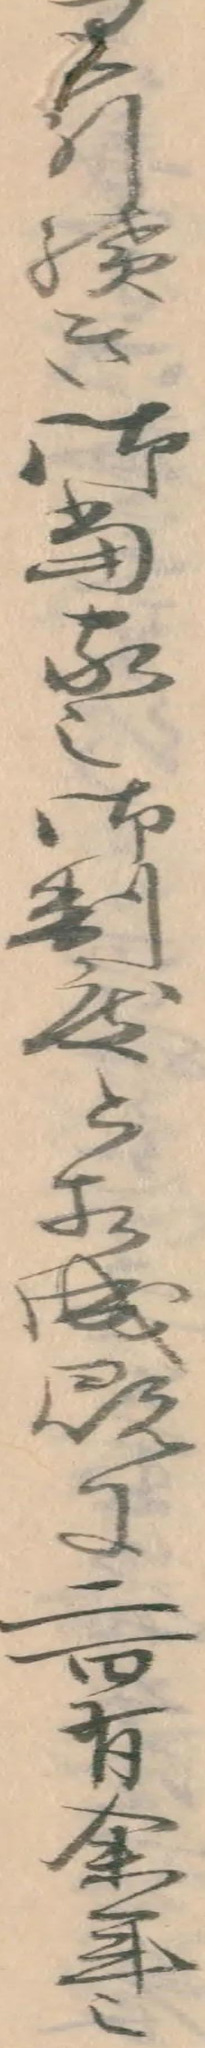り引続き御当家之御制度と相成既に二百有余年之
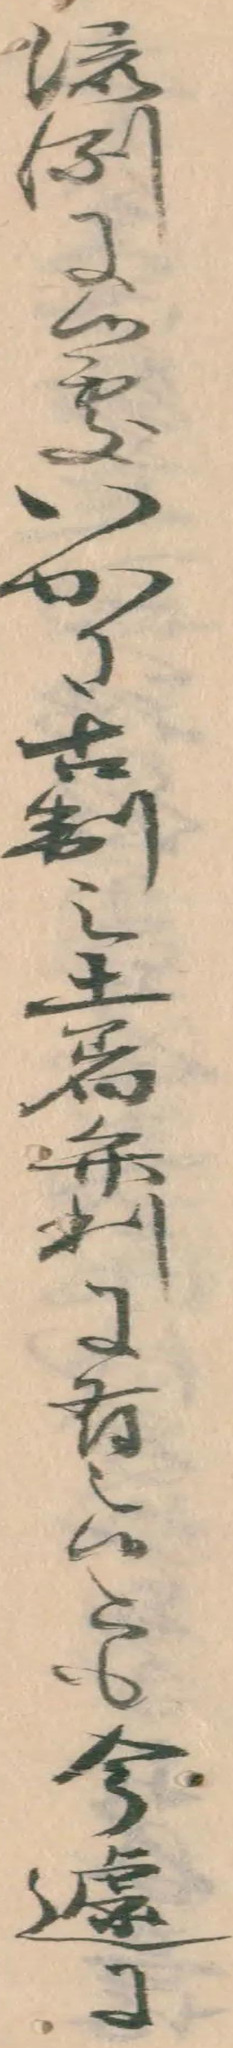流例に候処いかに古制之土着弁利に有之候とも今遽に
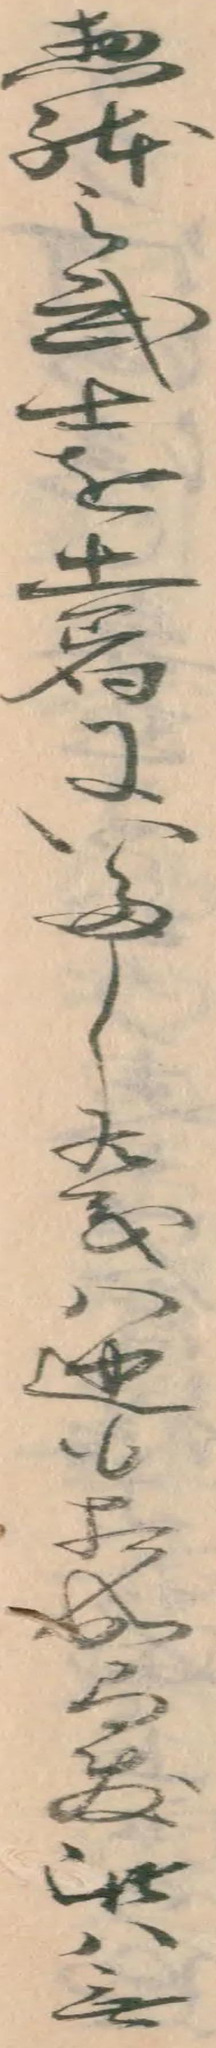惣体之武士を土着にいたし候義は迚も相成間敷此は無
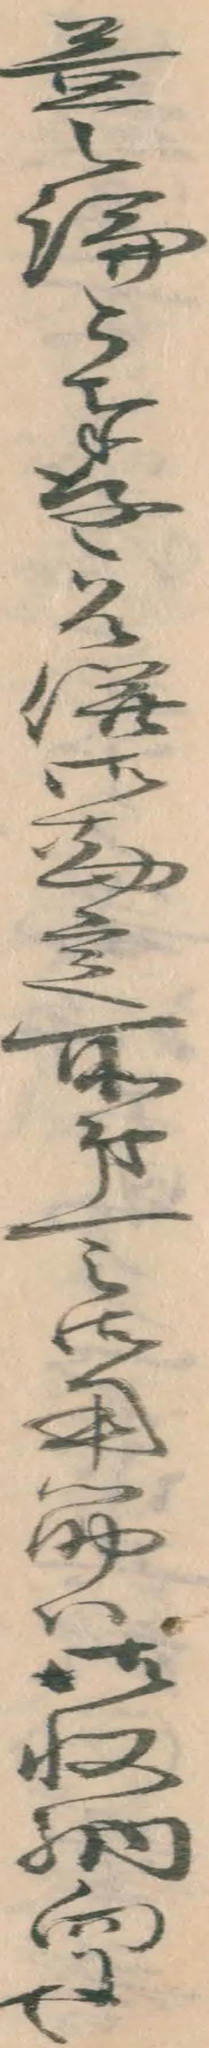益之論と奉存候乍併御勘定所第一之御用筋は御収納向にて
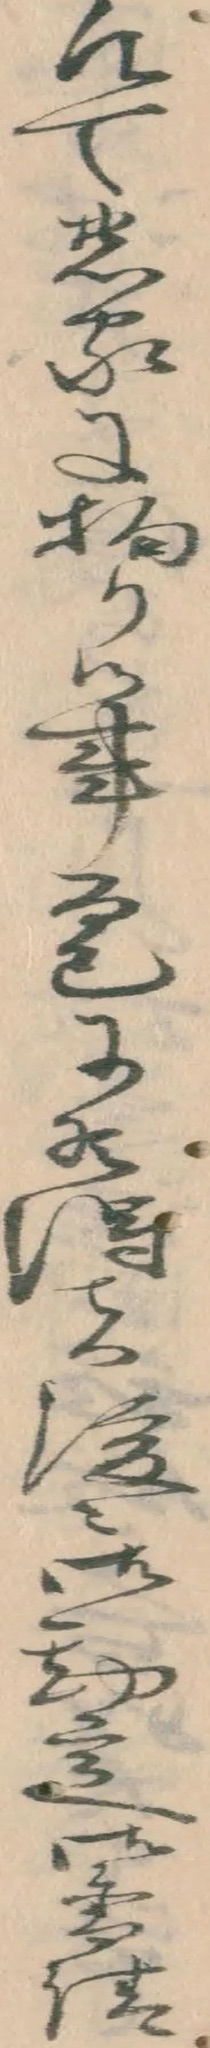凡て農家に拘り候事而已に候得は後々御勘定御普請
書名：斎庭之穂
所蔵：国立国会図書館 National Diet Library, JAPAN
